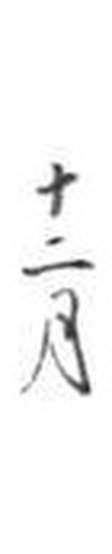十二月
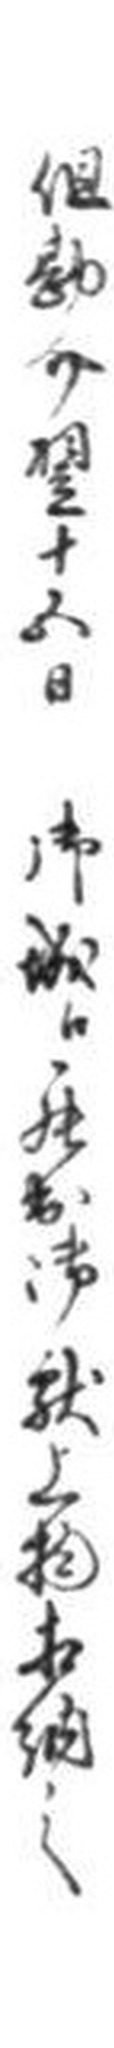但勘介翌十五日御城江罷出御献上物相納之
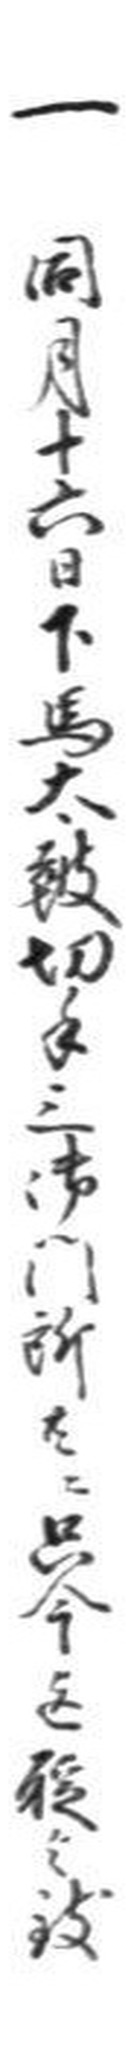一同月十六日下馬太鼓切手三御門所共ニ只今迄聢与致
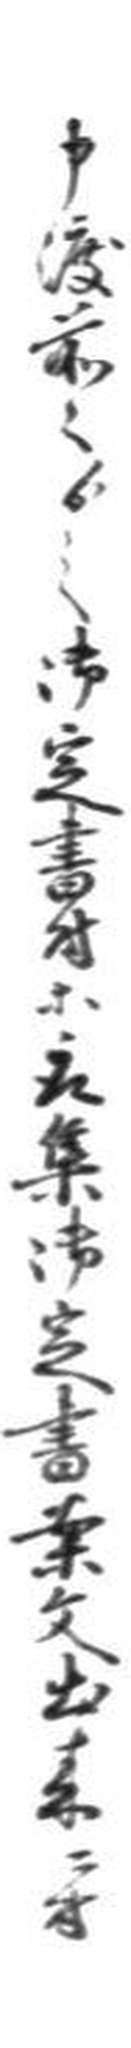申渡前々ゟ之御定書等取集御定書案文出来ニ付
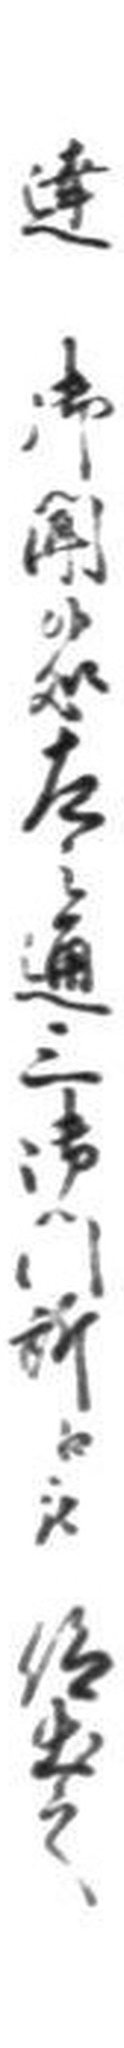達御聞候処左之通三御門所江被仰出之
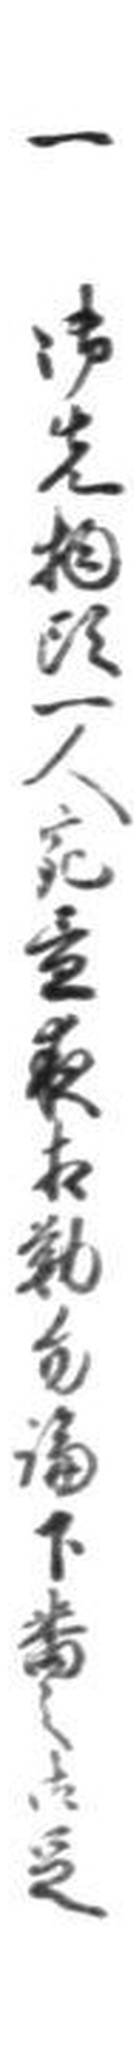一御先物頭一人宛昼夜相勤勿論下番之御足
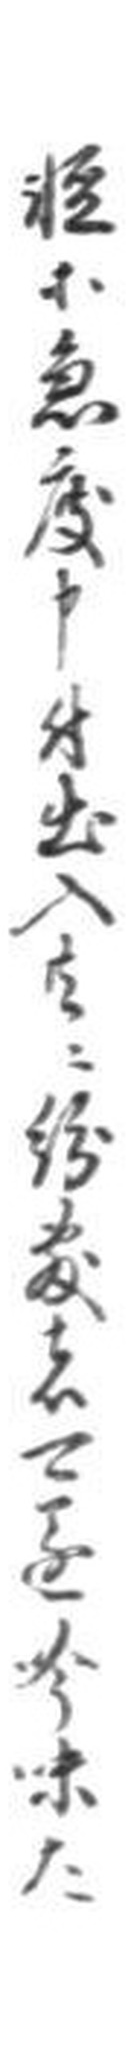軽等急度申付出入共ニ紛敷者可遂吟味た
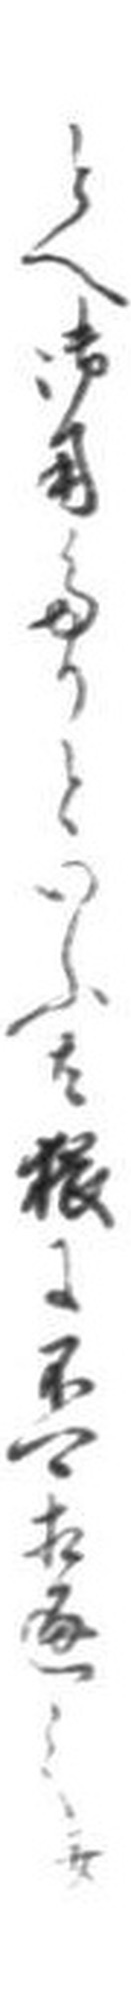とへ御用たりといふ共猥に不可相通之并
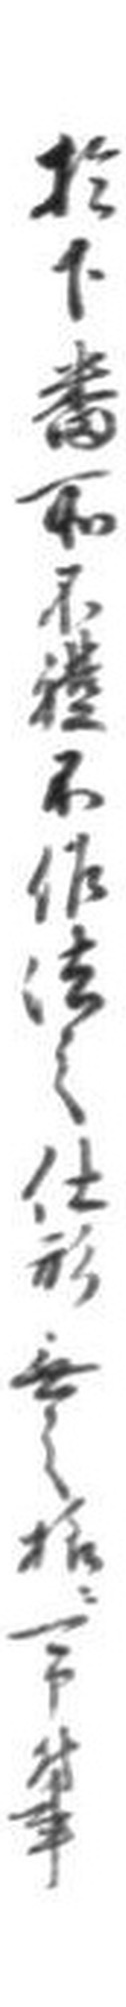於下番所不礼不作法之仕形無之様ニ可申付事

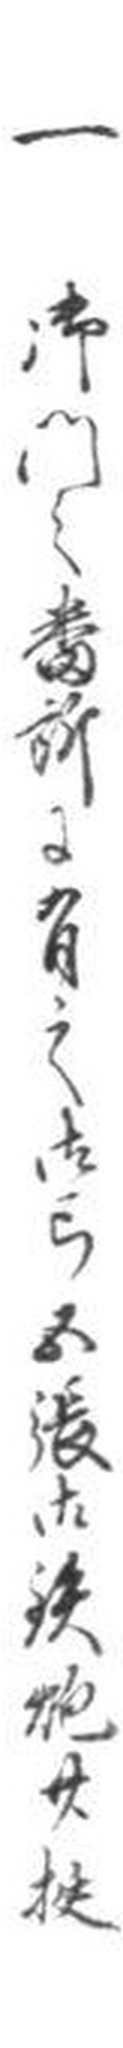一御門之番所に有之御弓五張鉄炮廿挺
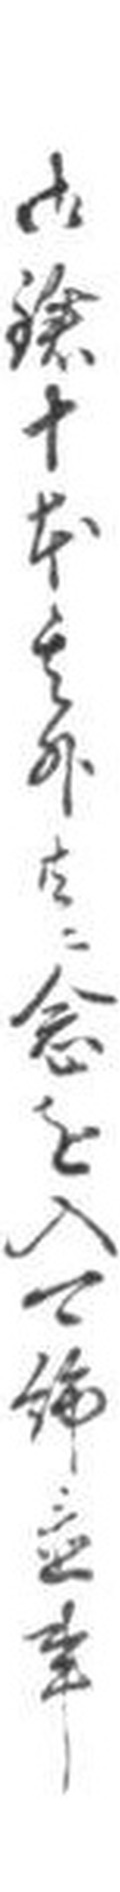御鎗十本其外共ニ念を入可飾置事
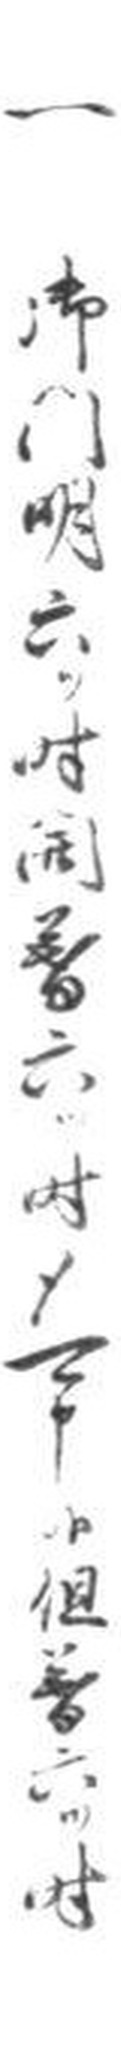一御門明六ツ時開暮六ツ時〆可申候但暮六ツ時
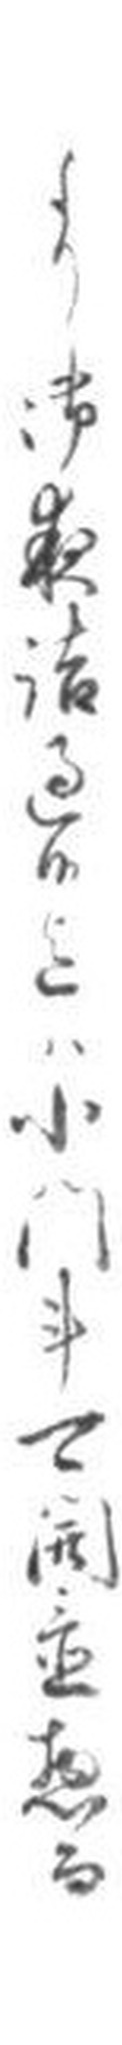より御夜詰過候迄ハ小門斗可開置惣而
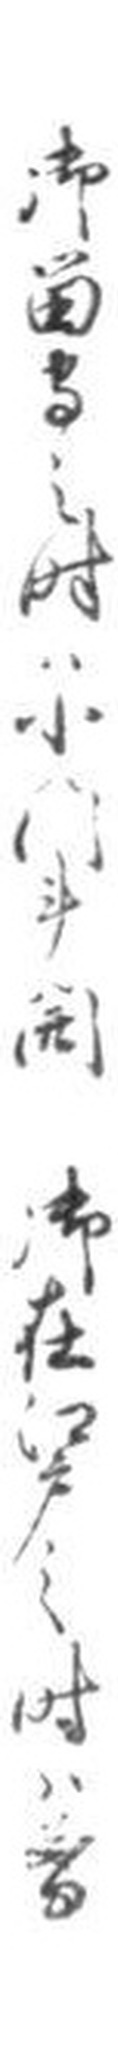御留守之時ハ小門斗開御在江戸之時ハ暮
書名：家譜 三十三 吉邦公 享保四年
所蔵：福井県文書館 Fukui Prefectural Archives
